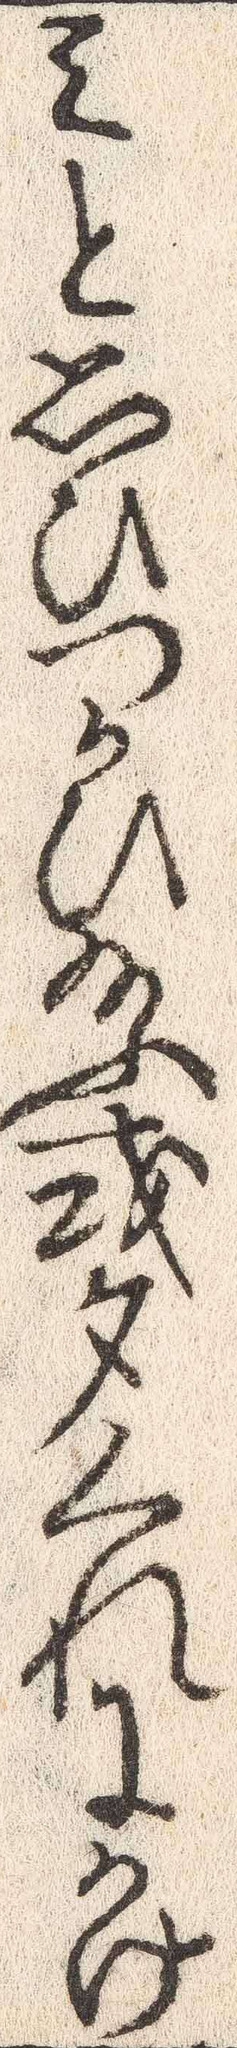みと思ひつかひ給ふ或夕くれにかけ
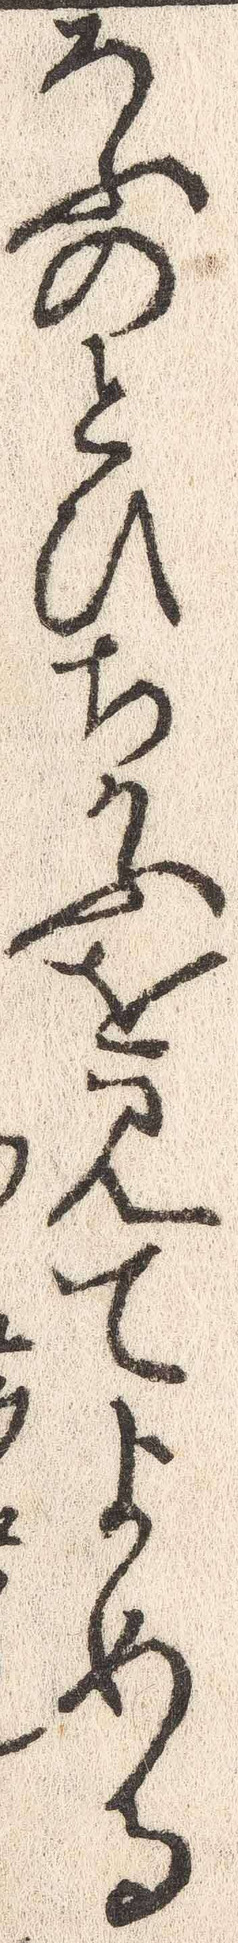ろふのとひちかふをみてよめる
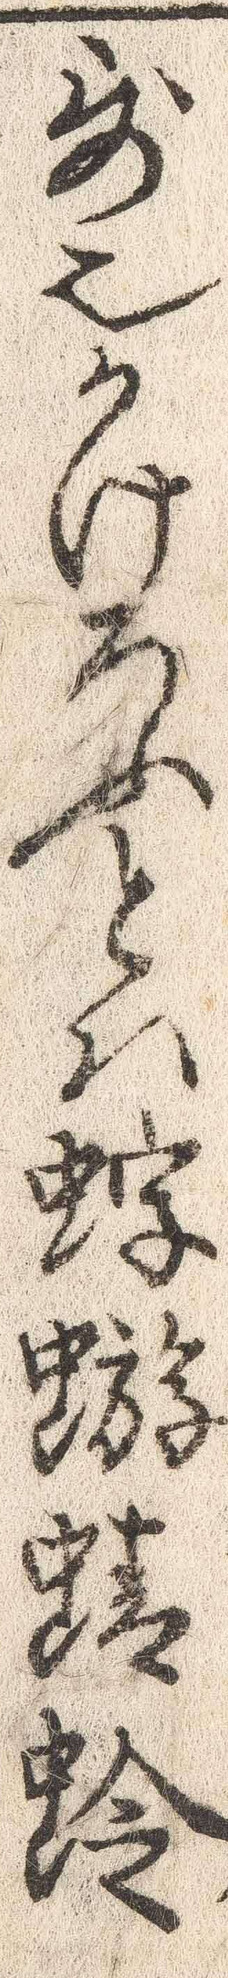也かけろふとは蜉蝣蜻蛉

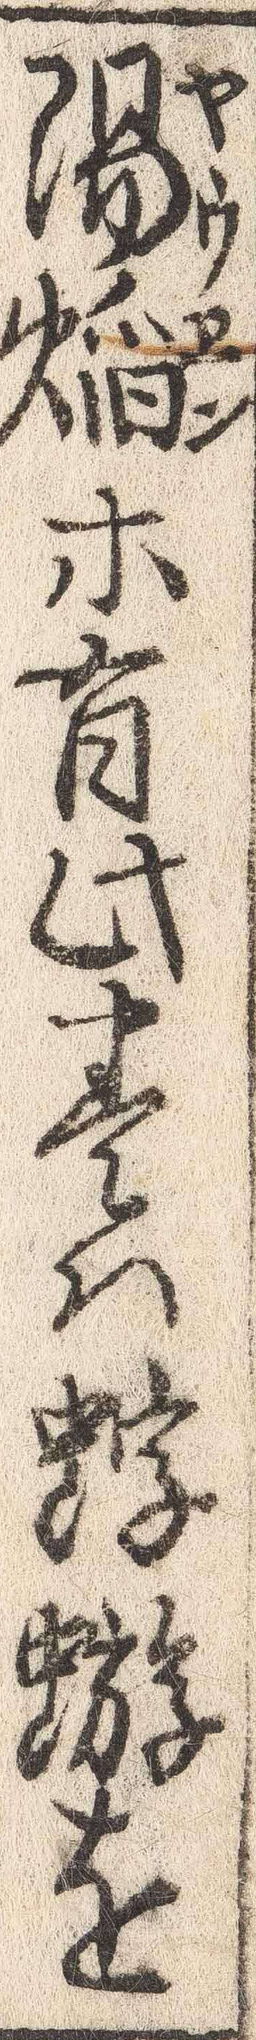陽焔有此巻は蜉蝣を
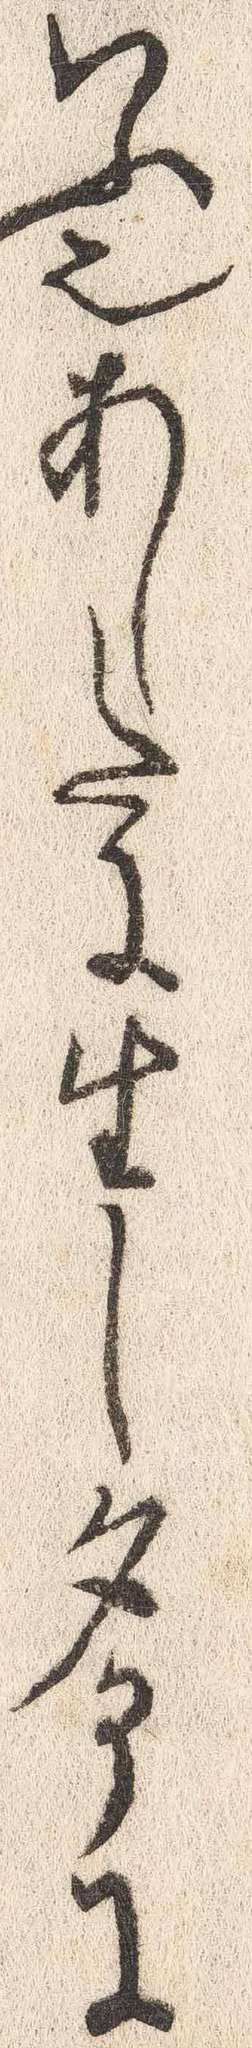いふ也あしたに生し夕に
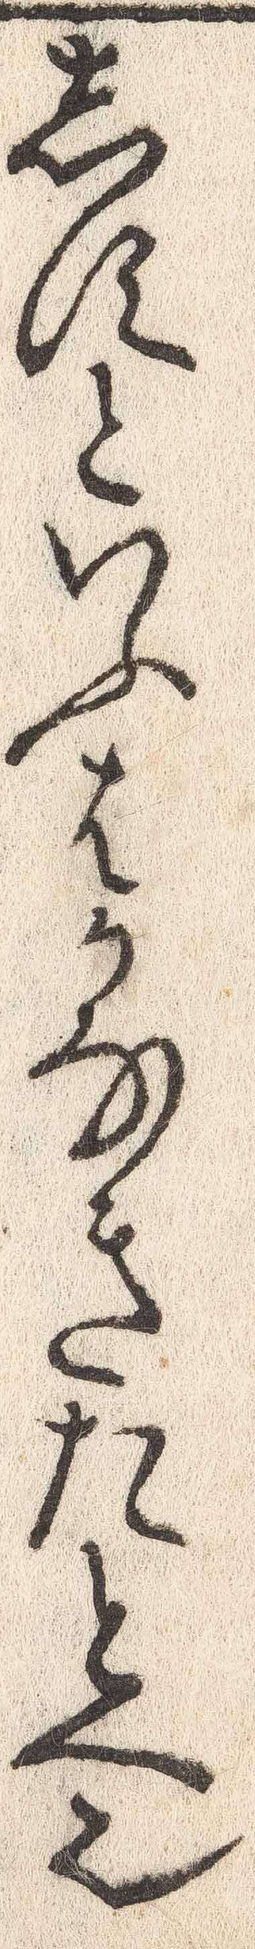しすとういふはかなきたとへ也
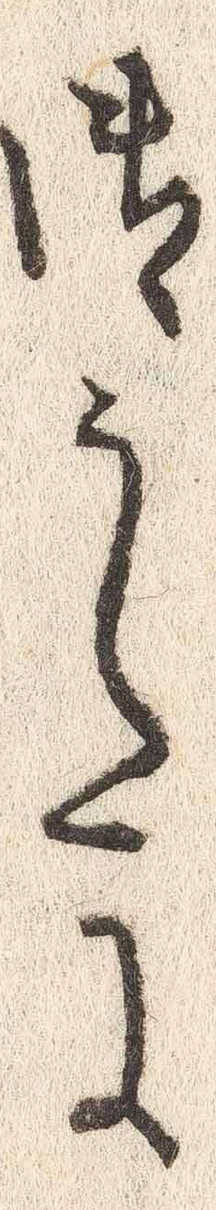御うたに
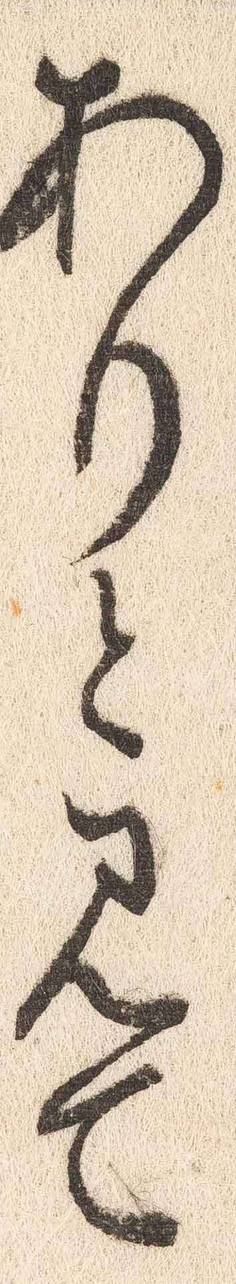ありとみて
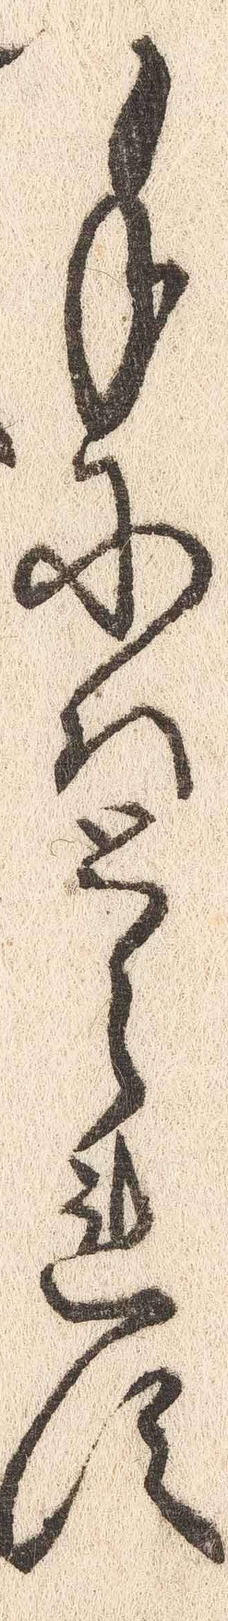手にはとられす
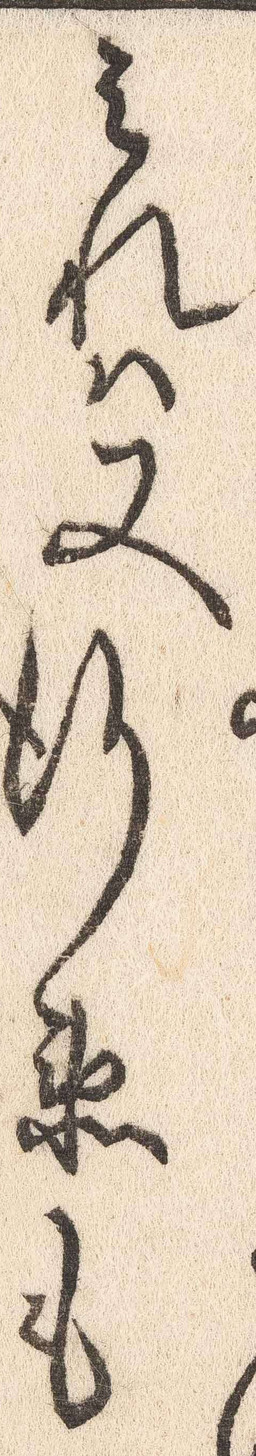みれは又行衛も
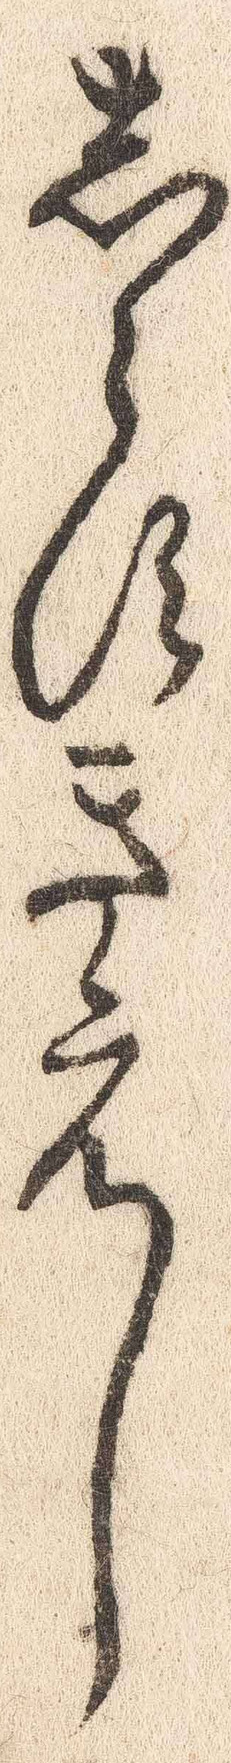しらすきえし
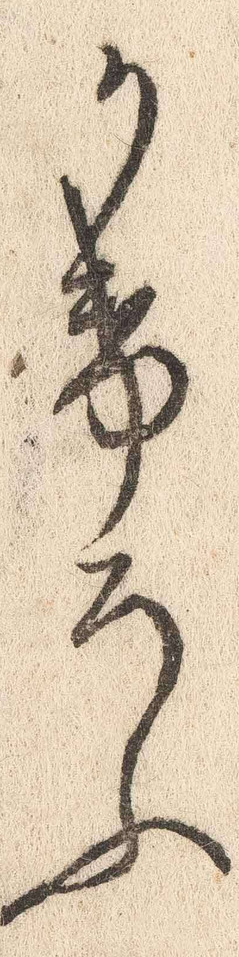かけろふ
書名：源氏物語
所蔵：東京学芸大学附属図書館 国文学研究資料館
